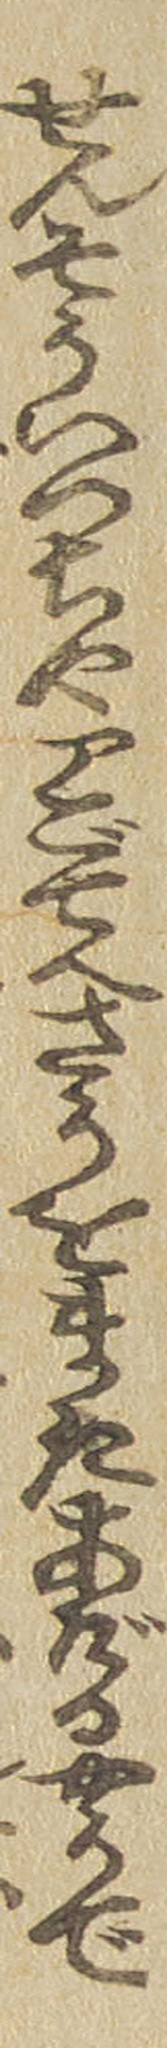せんそういつちやァごてへさうをまたあげるやうで
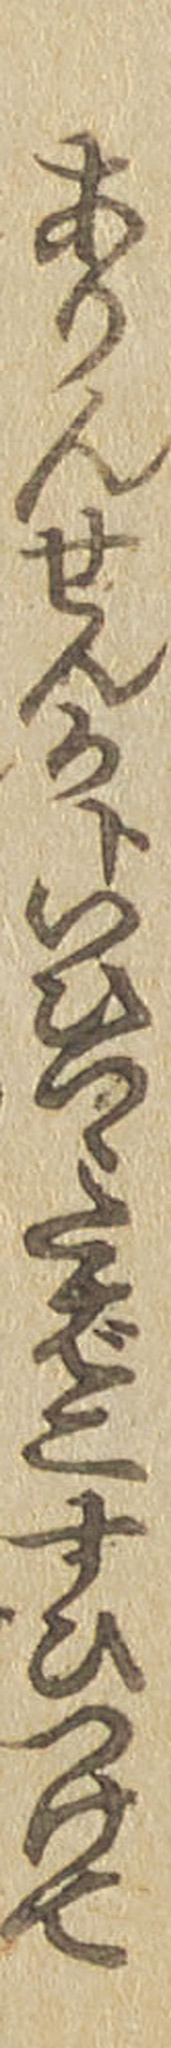ありんせんかトいひつゝたばこすひつけて
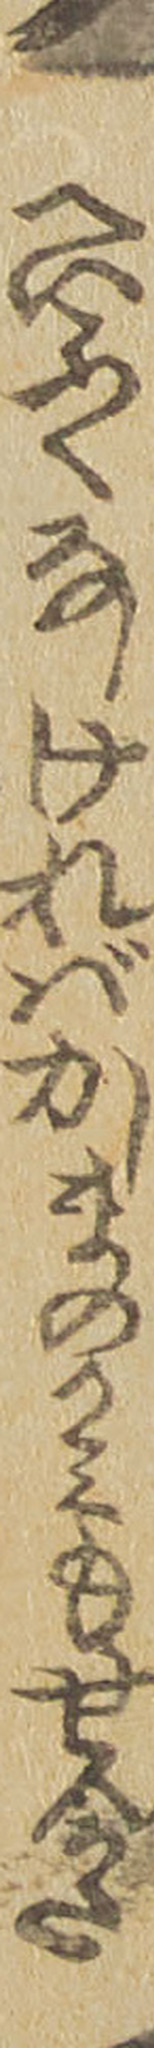へいふくなしければかしまのかみもせんかた
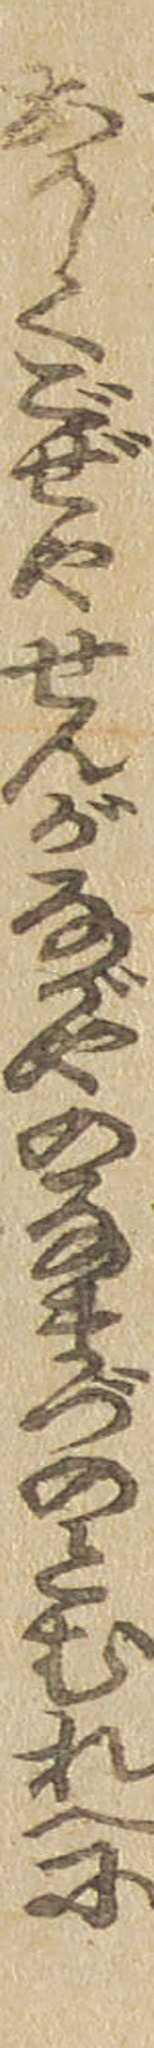おかしくごぜやせんがながやのなまづのとむれへに
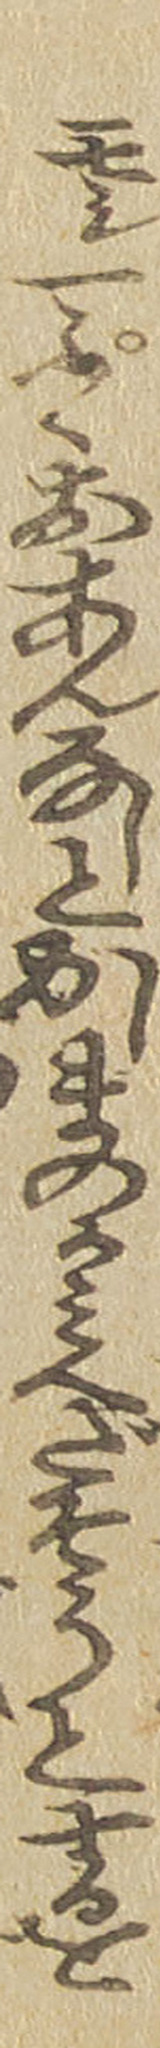モシ一ぷくおあんなしとかしまのかみへだそうとするを
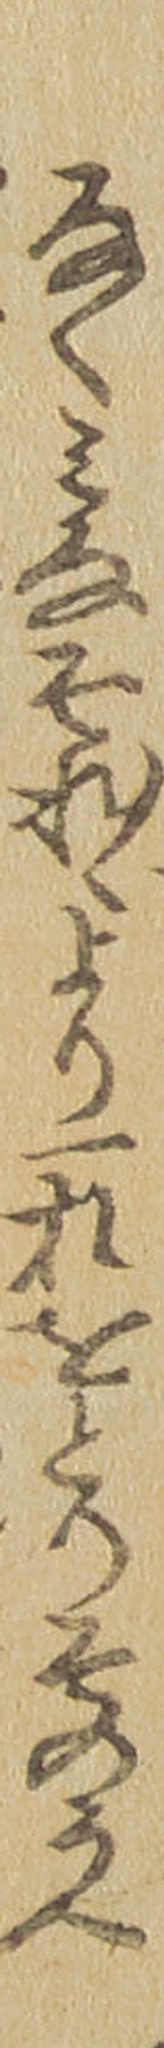なくみなそれ〳〵より一札をとりそのうへ
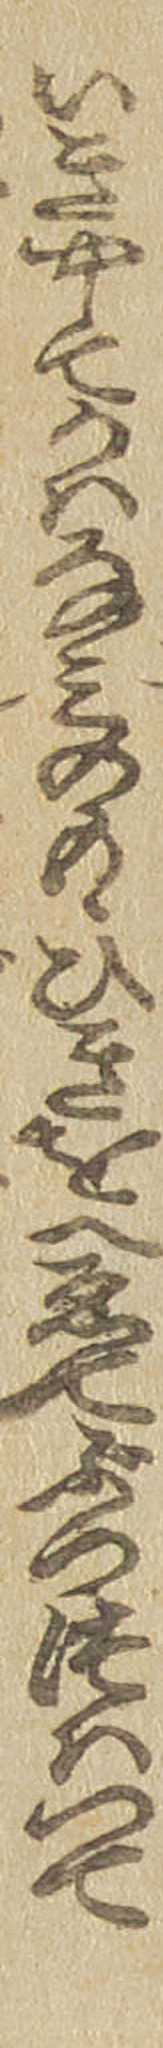いきやしてかはなみのもゝひきをへゑてぶつつはつて
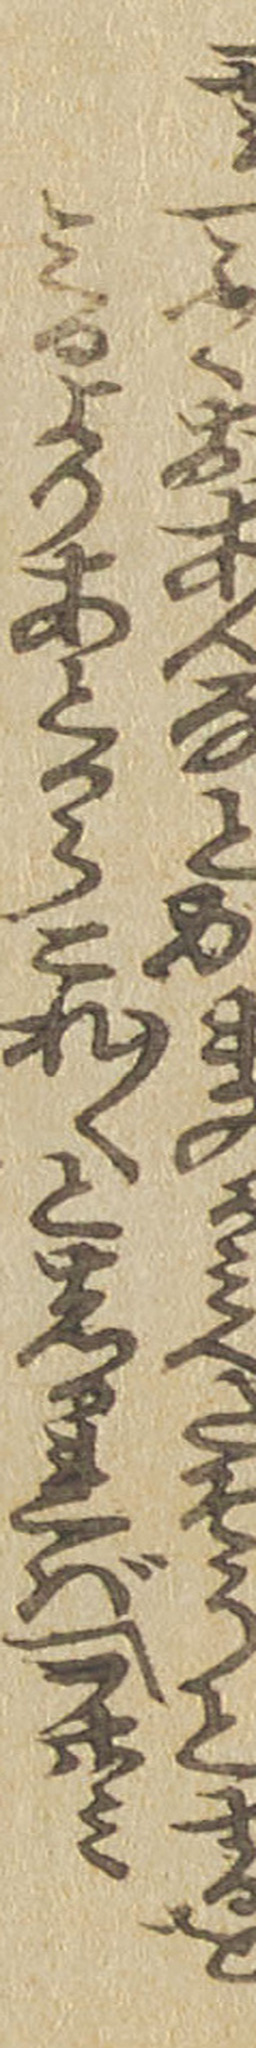みるよりあとからこれ〳〵としかれば｢ヲホヽヽ
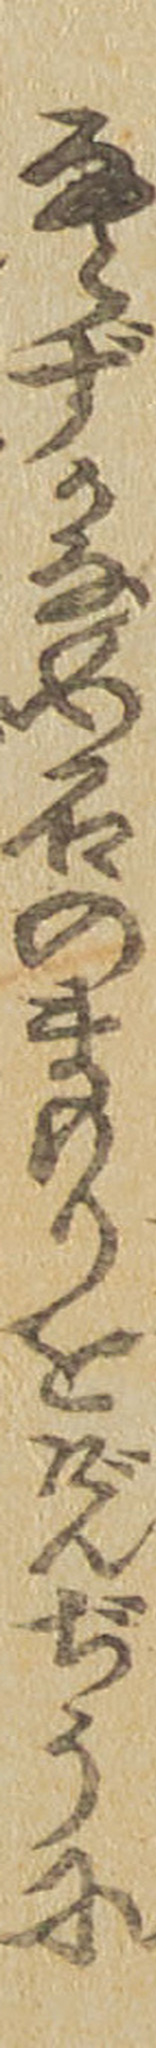ならずかなめ石のまもりをげんぢうに
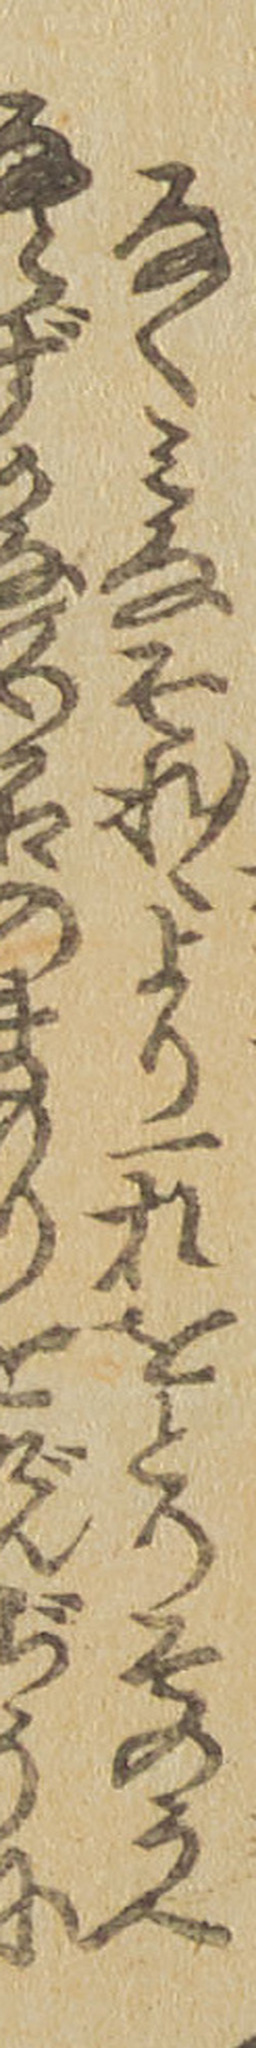ならずかなめ石のまもりをげんぢうに
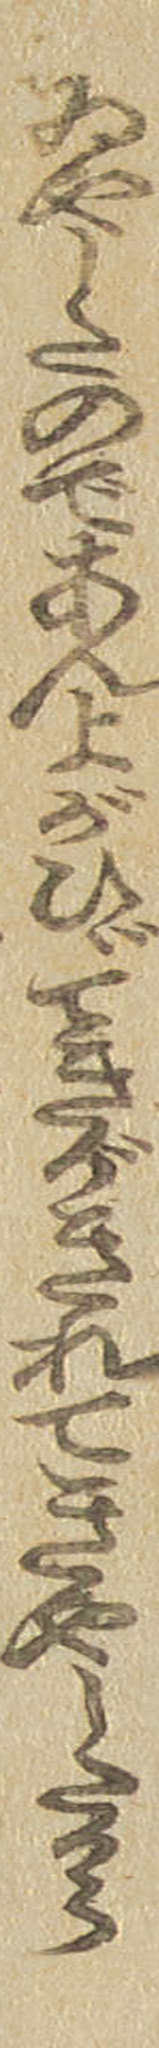ゐやしたのであんよがひゞてきがきれてきやしたから
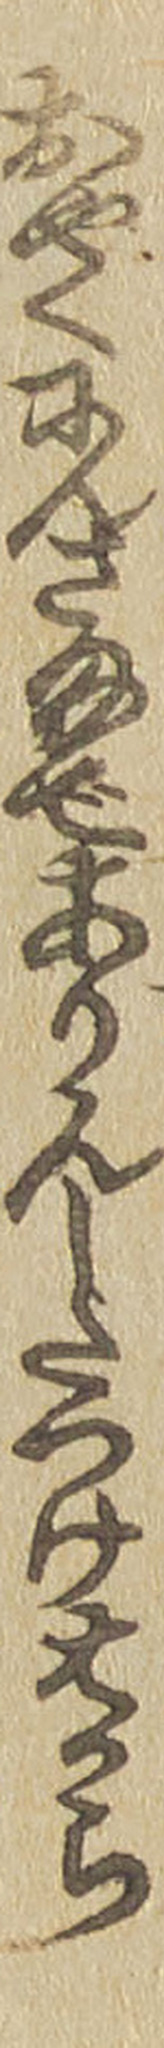おやくにんさまでありんしたつけはから
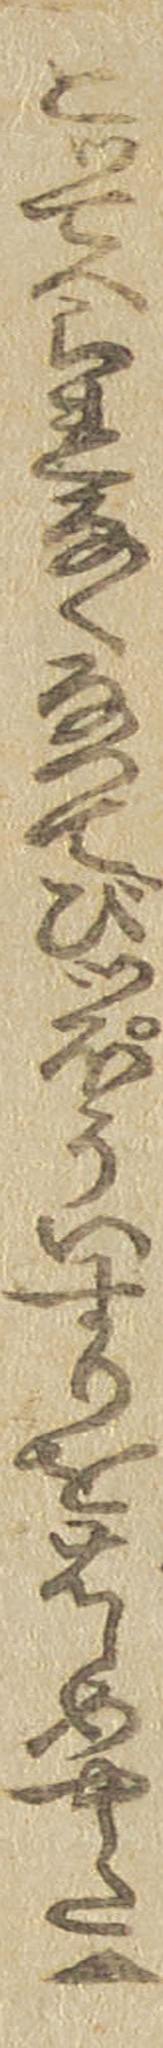こってへられなくなつてびっぽういすりをはしめやした▲
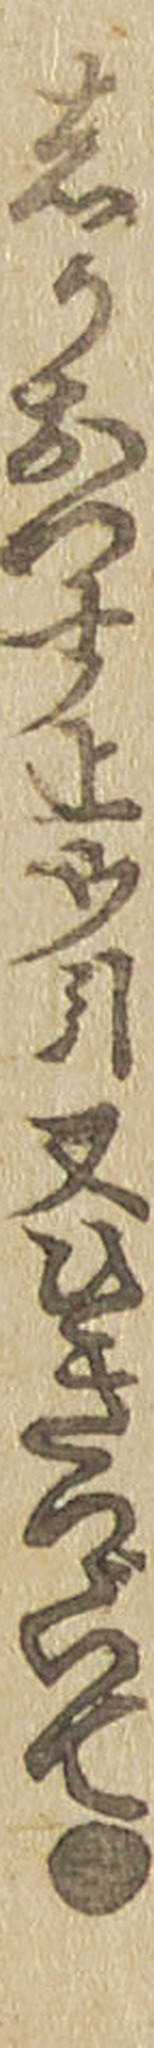しりおつすよウ引又ひきつゞいて●
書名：地震太平記
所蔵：東京大学総合図書館 General Library in the University of Tokyo, JAPAN
